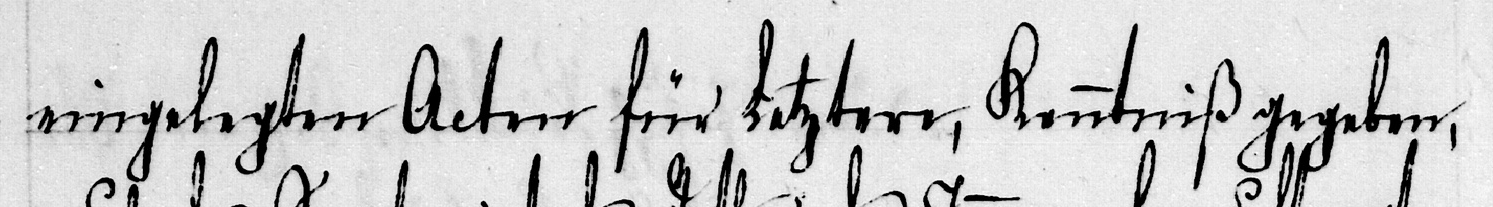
eingelegten Acten für Letztere, Kenntniß gegeben,
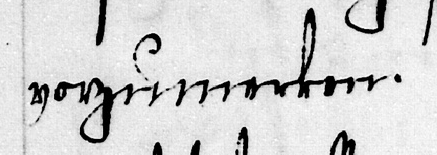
vorzumerken.
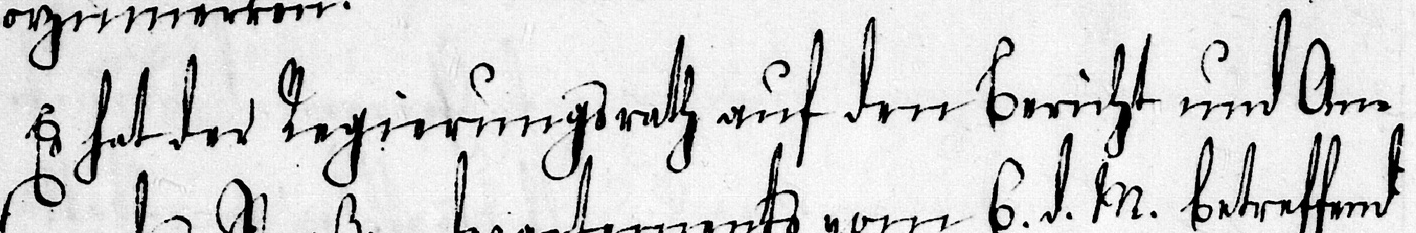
Es hat der Regierungsrath auf den Bericht und An¬
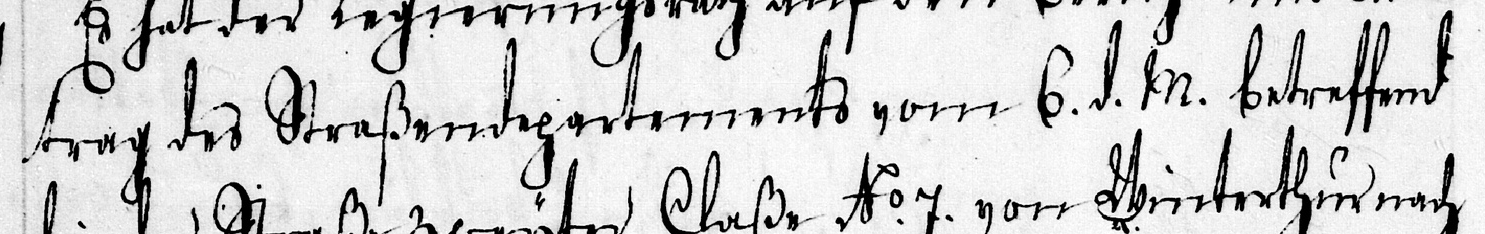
trag des Straßendepartements vom 6. d. M. betreffend
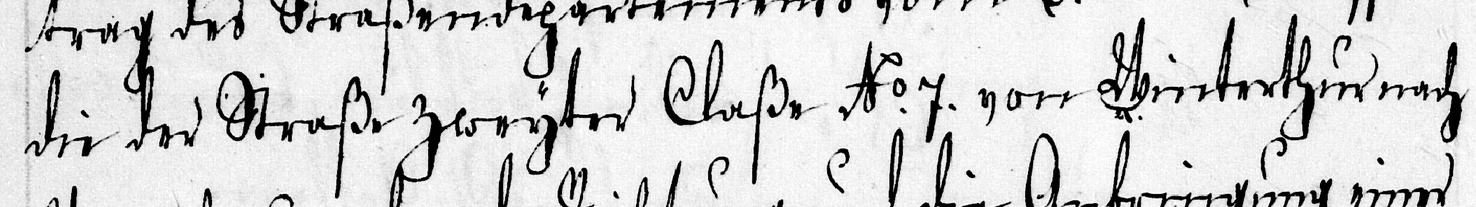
die der Straße zweyter Claße No.7. von Winterthur nach
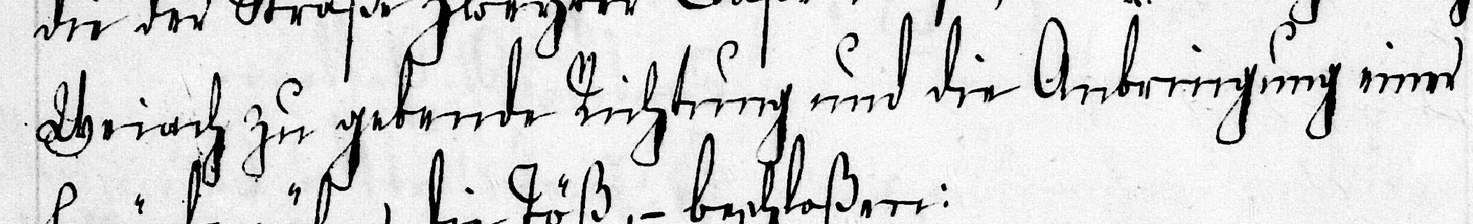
Weiach zu gebende Richtung und die Anbringung einer
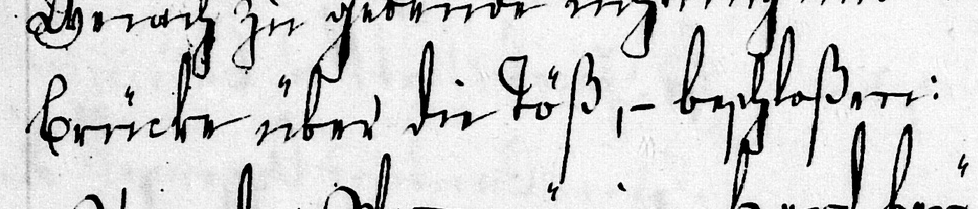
Brücke über die Töß, – beschloßen:
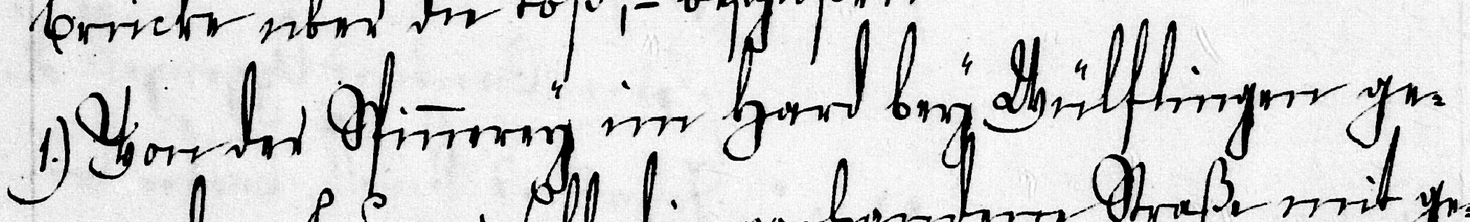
1.) Von der Spinnerey im Hard bey Wülflingen ge¬
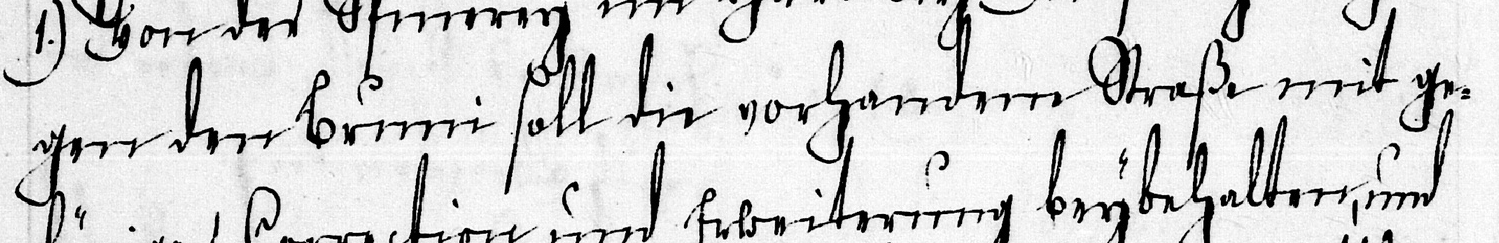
gen den Bruni soll vorhandene Straße mit ge¬
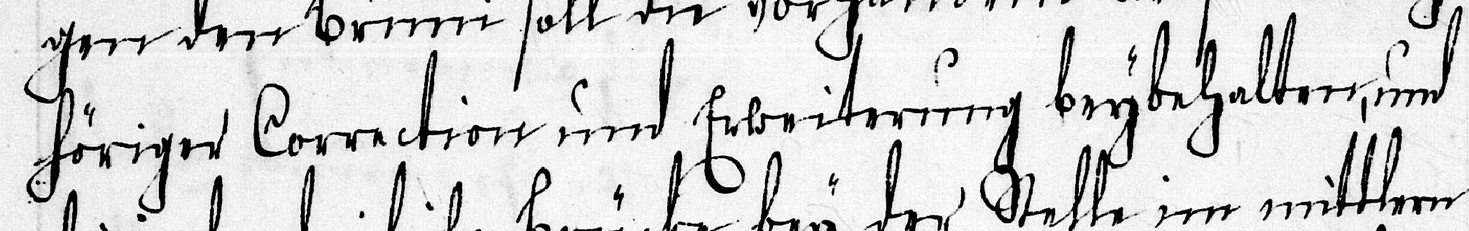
höriger Correction und Erweiterung beybehalten, und
